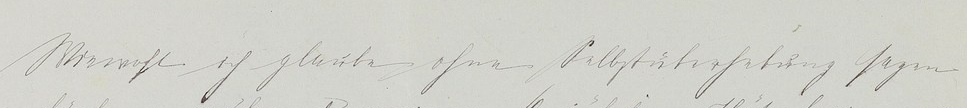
Wiewohl ich glaube ohne Selbstüberhebung sagen
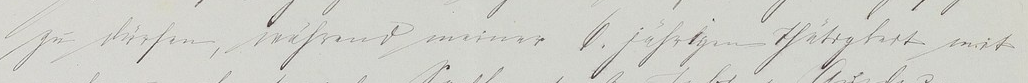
zu dürfen, während meiner 6.jährigen Thätigkeit mit
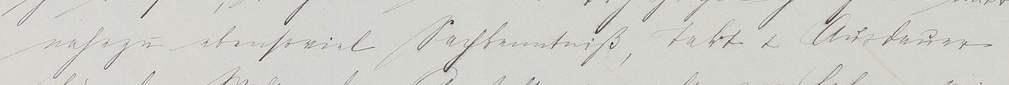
nahezu ebensoviel Sachkenntniß, Takt & Ausdauer
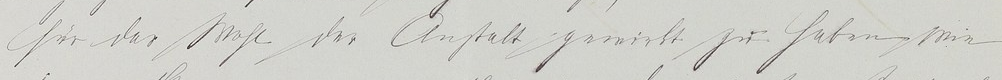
für das Wohl der Anstalt gewirkt zu haben wie
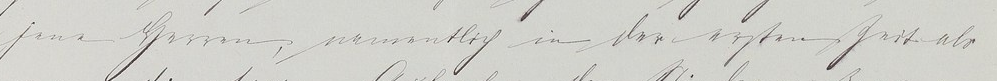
jene Herren, namentlich in der ersten Zeit als
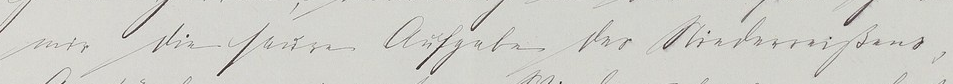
mir die saure Aufgabe des Niederreißens,
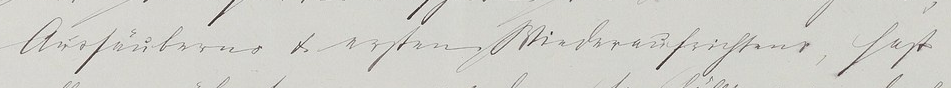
Aussäuberns & ersten Wiederaufrichtens, fast
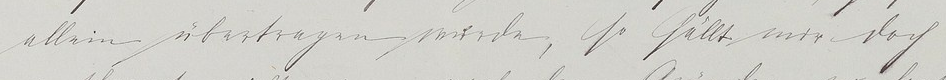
allein übertragen wurde, so fällt mir doch
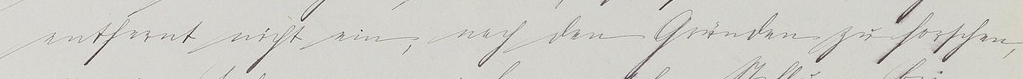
entfernt nicht ein, nach den Gründen zu forschen,
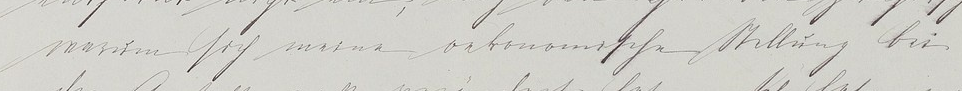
warum sich meine oekonomische Stellung bei
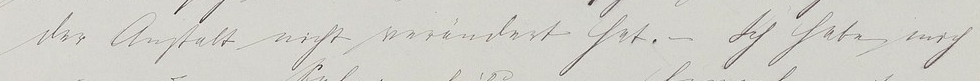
der Anstalt nicht verändert hat. – Ich habe mich
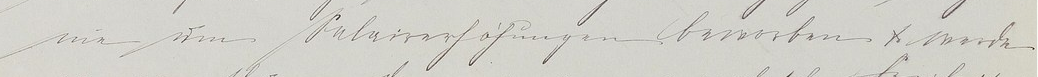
nie um Salairerhöhungen beworben & werde
